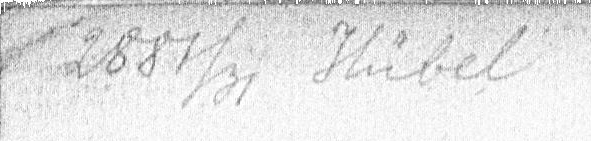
2881/31 Hübel
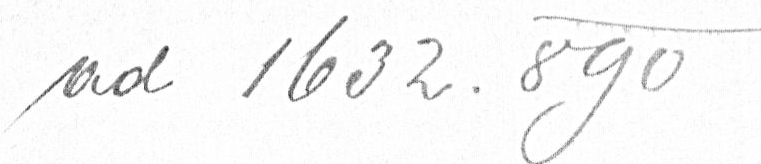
ad 1632. 890
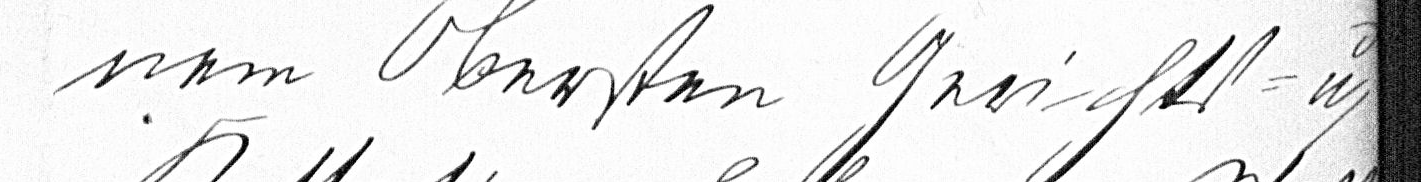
nem Obersten Gerichts- uxx
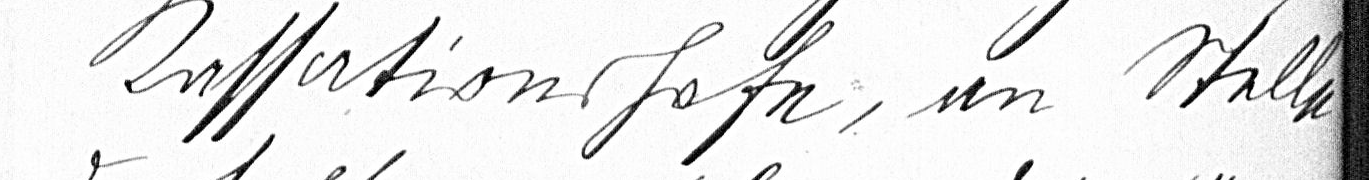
Kassationshofe, an Stelle
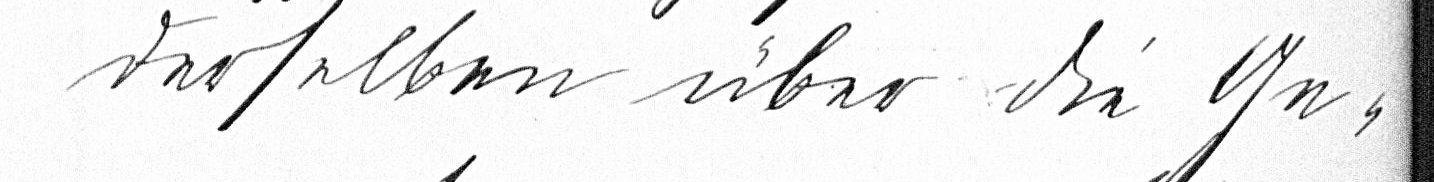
derselben über die Ge¬
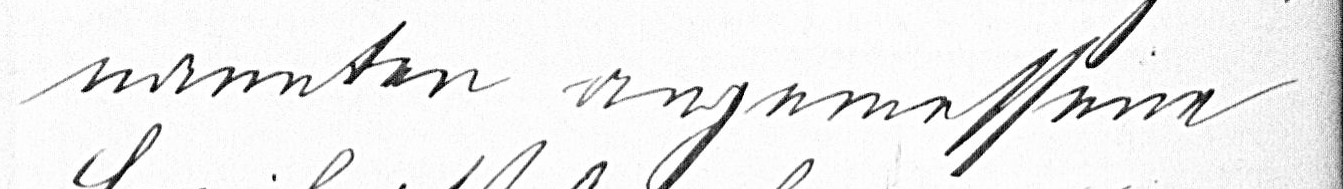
nannten angemessene
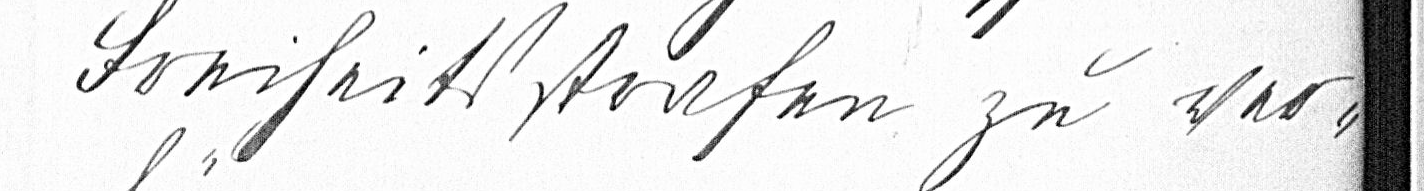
Streiheitsstrafen zu ver¬
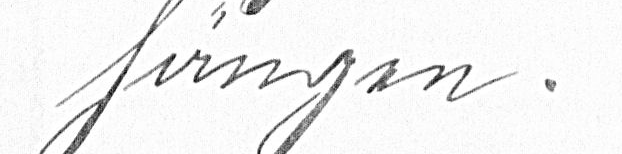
hängen.
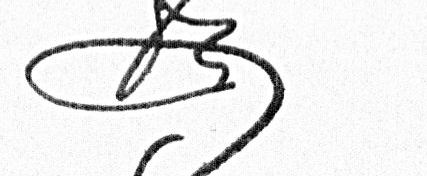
xx
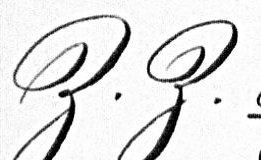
Z.Z.
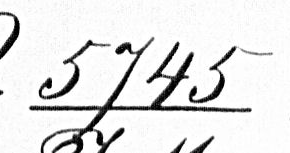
5745
